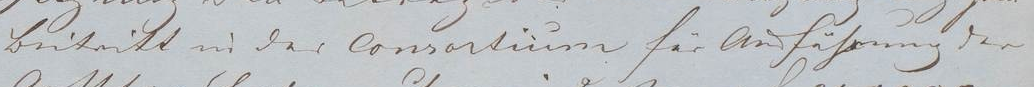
Beitritt in das Consortium für Ausführung der
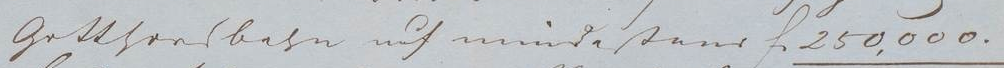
Gotthardbahn auf mindestens f. 250,000.–
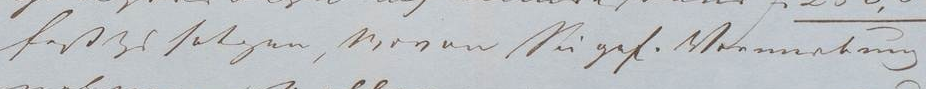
festzusetzen, wovon Sie gef. Vermerkung
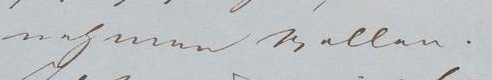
nehmen wollen.
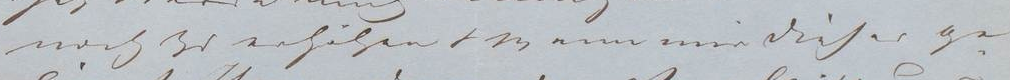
noch zu erhöhen & wenn mir dieses ge-
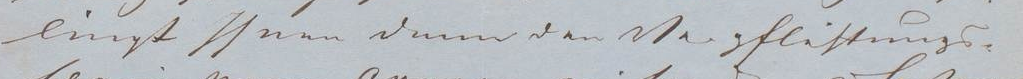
lingt Ihnen dann den Verpflichtungs-
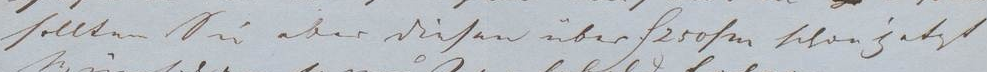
sollten Sie aber diesen über f 250/m schon jetzt
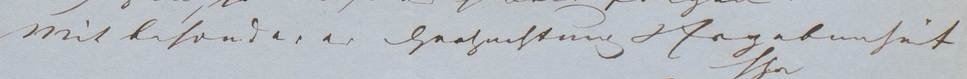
Mit besonderer Hochachtung & Ergebenheit
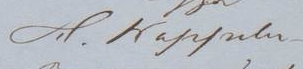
H. Kappeler
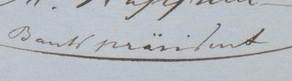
Bankpräsident
